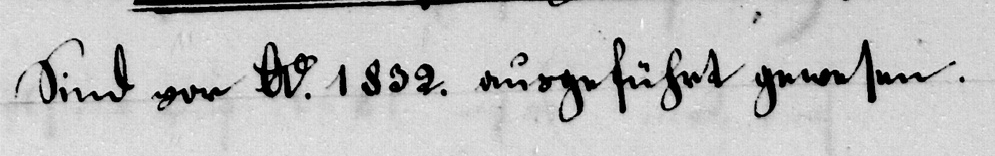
Sind vor A°. 1832. ausgeführt gewesen
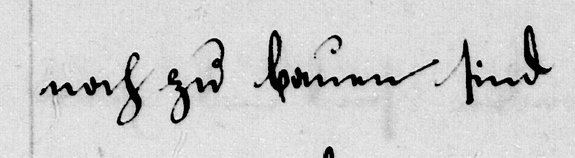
noch zu bauen sind
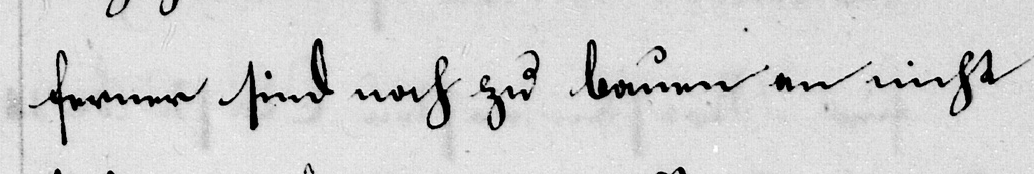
ferner sind noch zu bauen an nicht
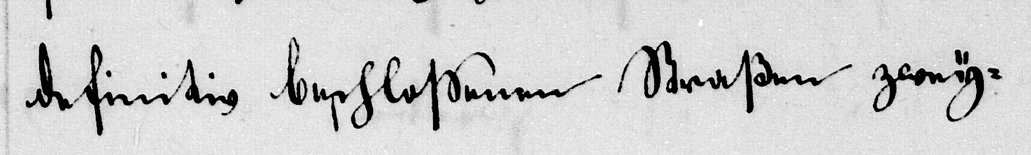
definitiv beschloßenen Straßen zwey¬
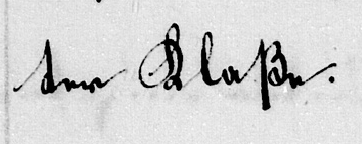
ter Klaße
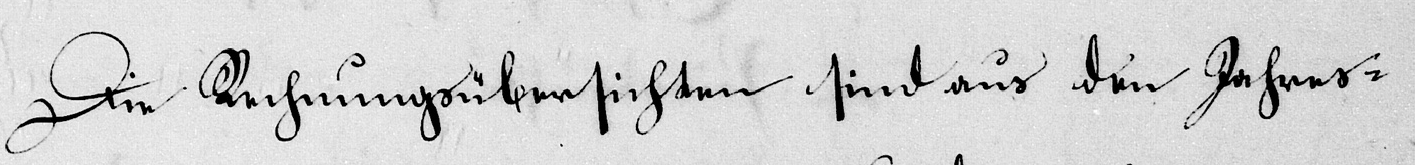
Die Rechnungsübersichten sind aus den Jahres¬
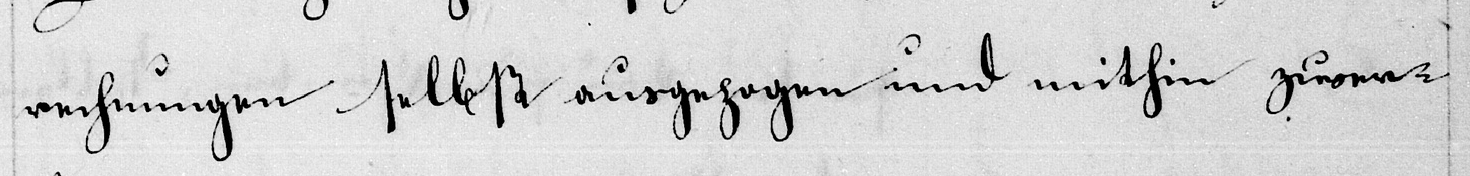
rechnungen selbst ausgezogen und mithin zuver¬
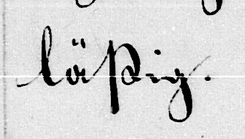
läßig.
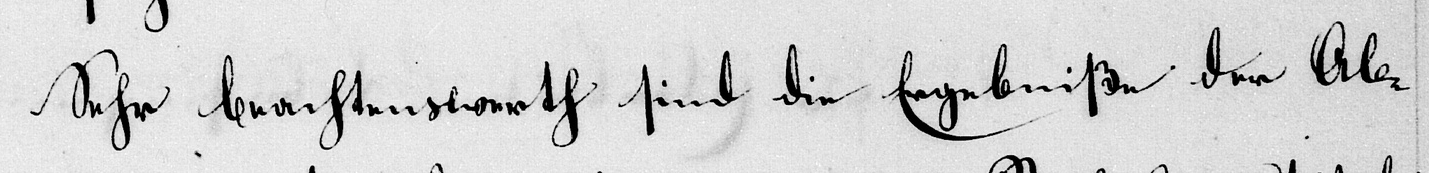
Sehr beachtenswerth sind die Ergebniße der Ab¬
